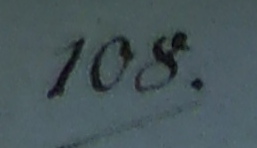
108.
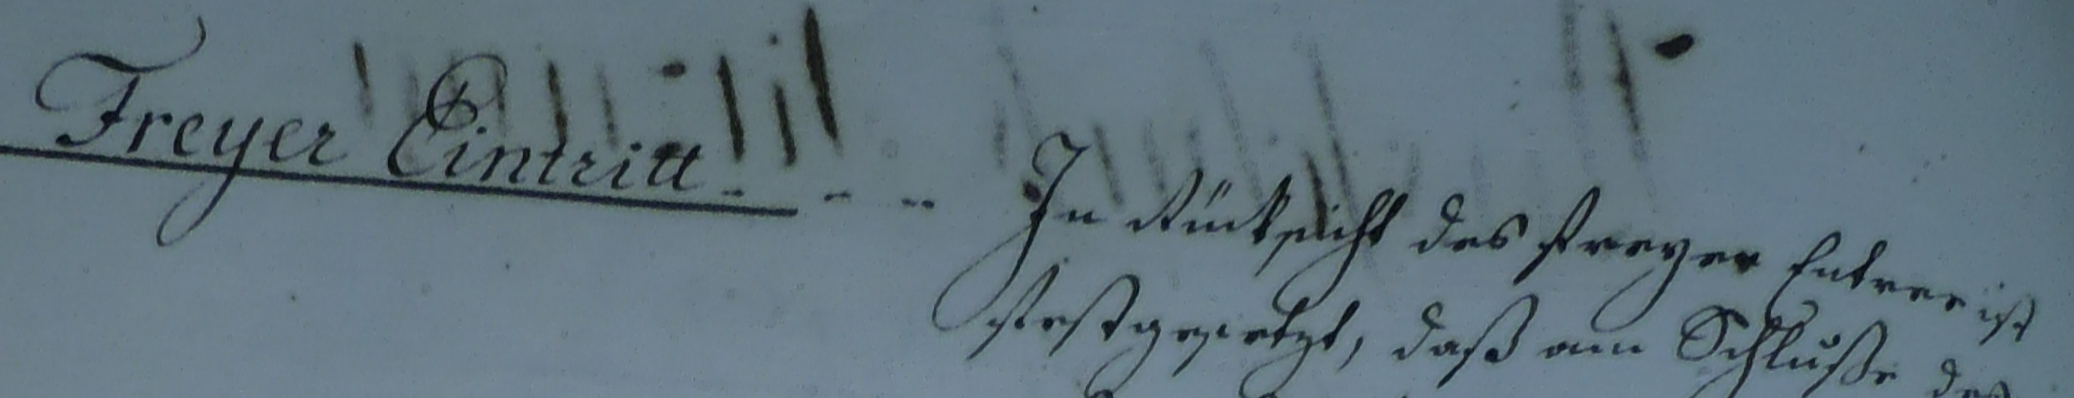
Freyer Eintritt .. .. .. In Rücksicht des freyen Entree ist
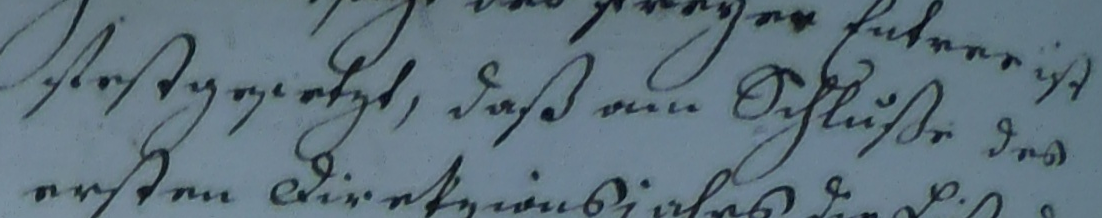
festgesetzt, daß am Schluße des
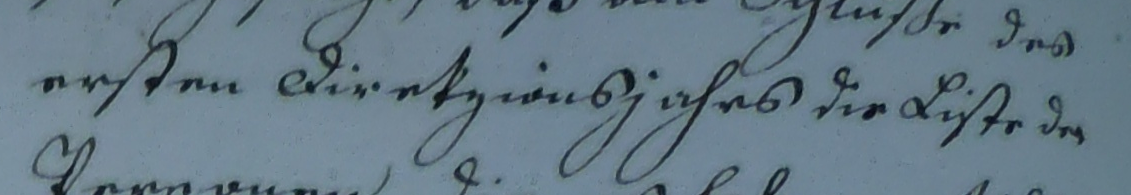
ersten Direkzionsjahrs die Liste der
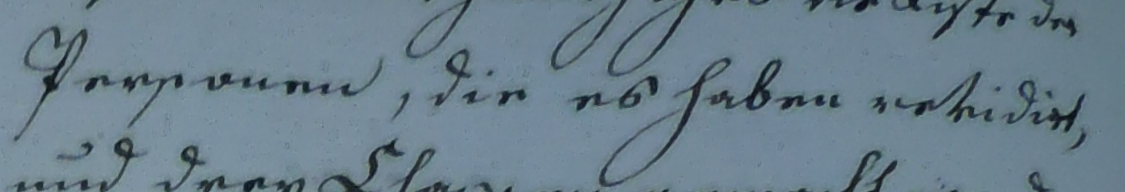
Personen, die es haben revidirt,
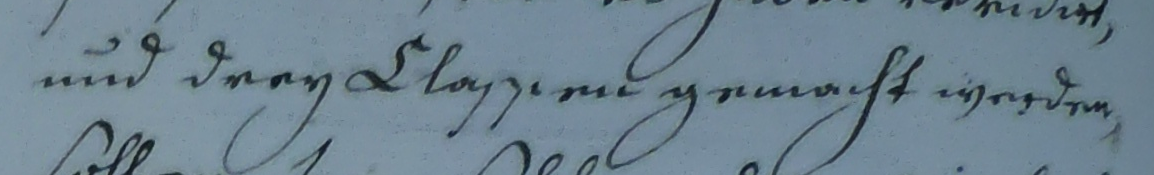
und drey Classen gemacht werden
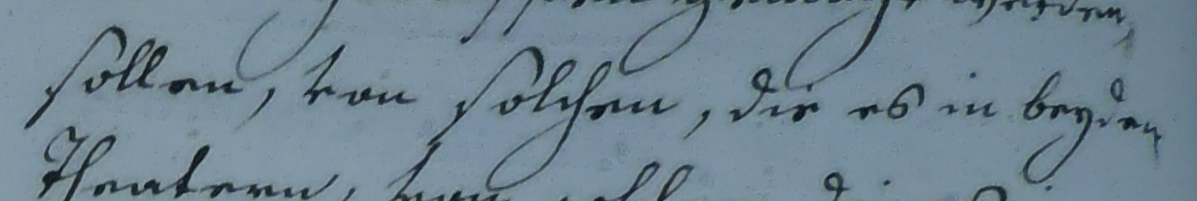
sollen, von solchen, die es in beyden
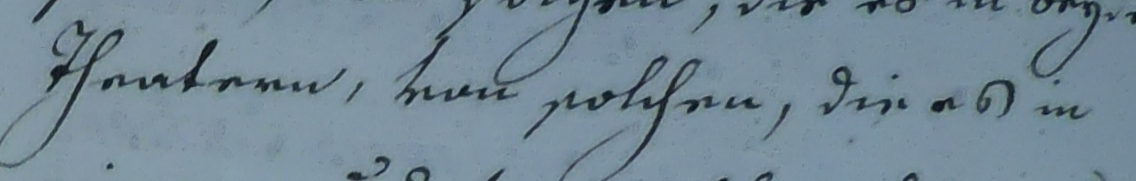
Theatern, von solchen, die es in
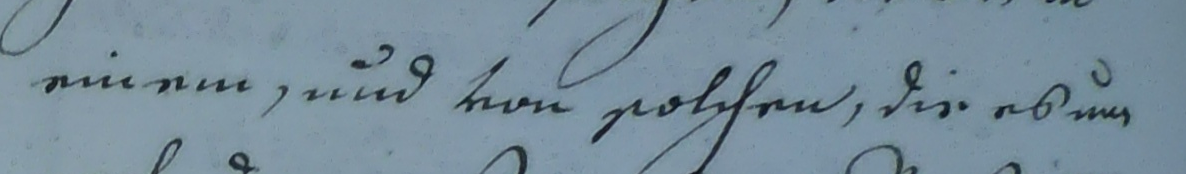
einem, und von solchen, die es nur
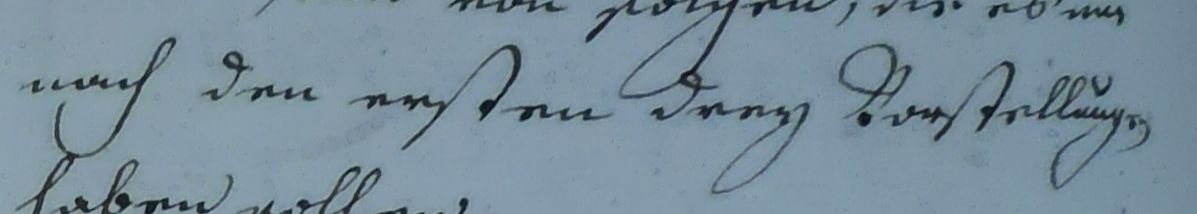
nach den ersten drey Vorstellungen
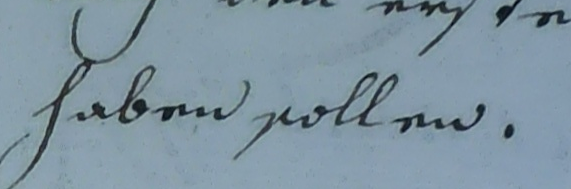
haben sollen.
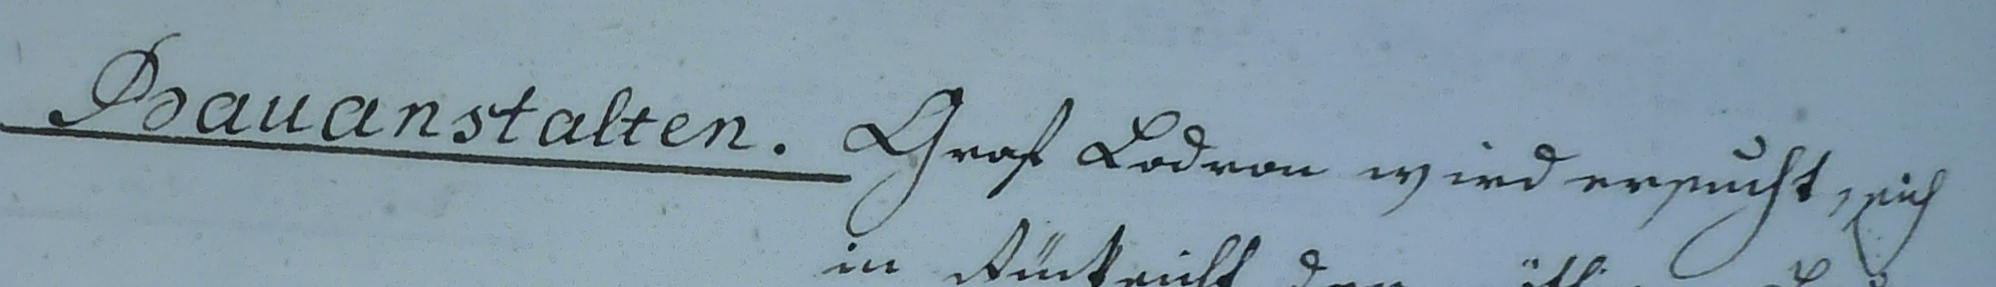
Bauanstalten. Graf Lodron wird ersucht, sich
